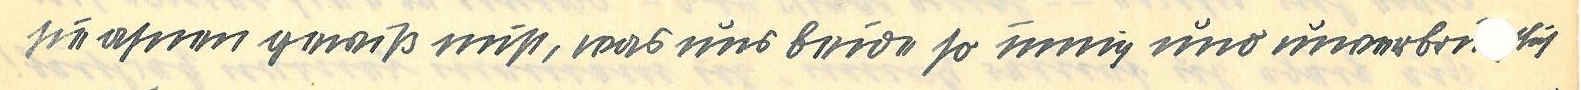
sie ahnen gewiß nicht, was uns beide so innig und unverbrlich
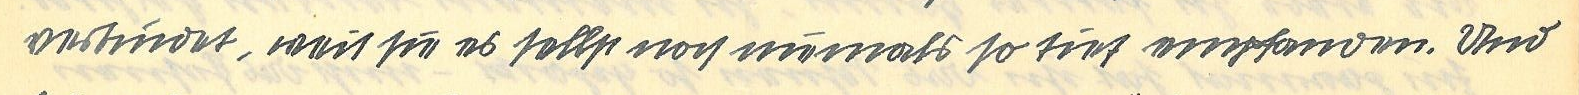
verbindet, weil sie es selbst noch niemals so tief empfanden. Und
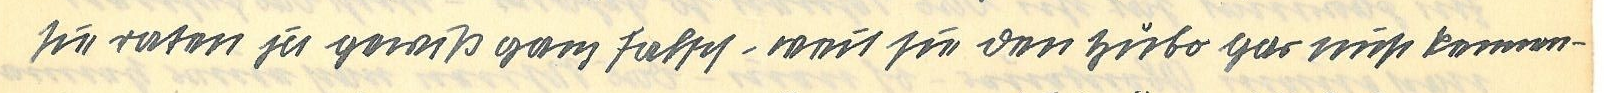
sie raten ja gewiß ganz falsch – weil sie den Hubo gar nicht kennen –
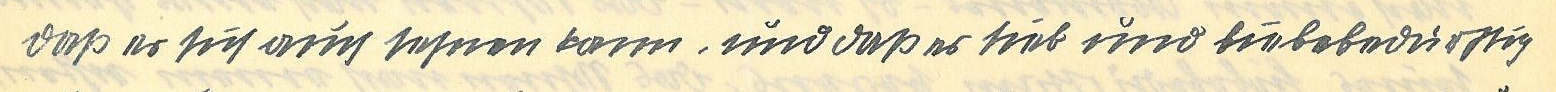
daß er sich auch sehnen kann, und daß er lieb und liebebedürftig
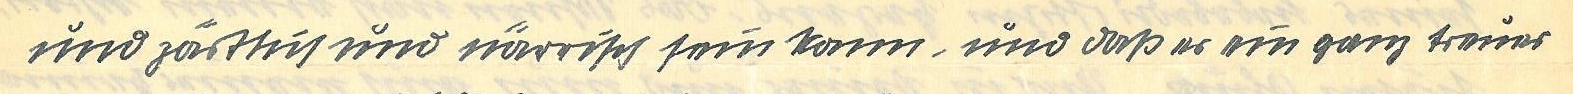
und zärtlich und närrisch sein kann, und daß er ein ganz treuer
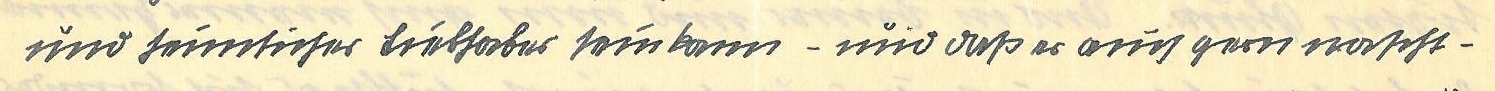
und sinnlicher Liebhaber sein kann – und daß er auch gern nascht –
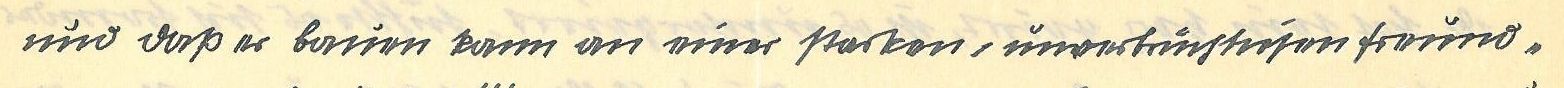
und daß er bauen kann an einer starken, unverbrüchlichen Freund¬
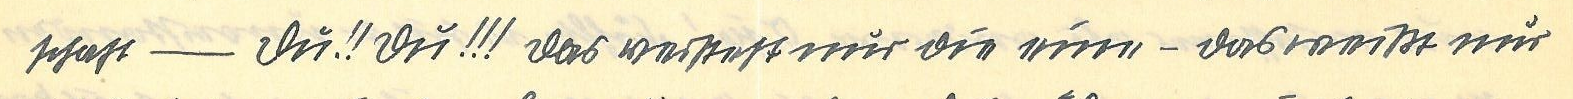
schaft — Du! Du!!! Das versteht nur die eine – das weißt nur
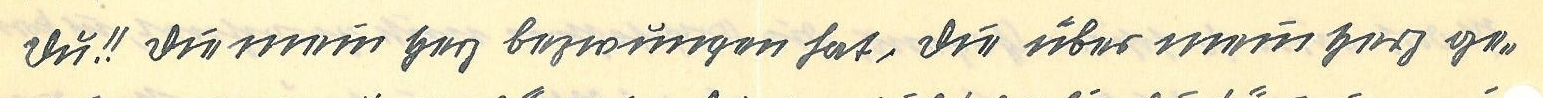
Du!! Die mein Herz bezwungen hat, die über mein Herz ge¬
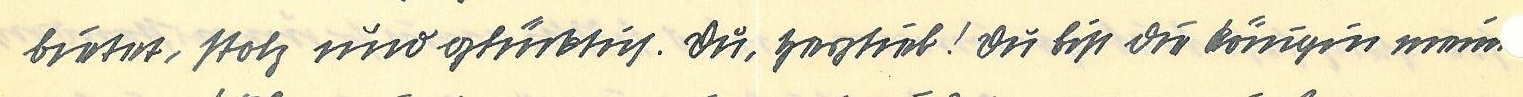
bietet, stolz und glücklich. Du, Herzlieb! Du bist die Königin meine
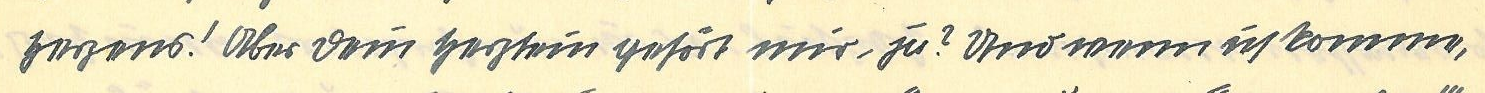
Herzens! Aber Dein Herzlein gehört mir, ja! Und wenn ich komme,
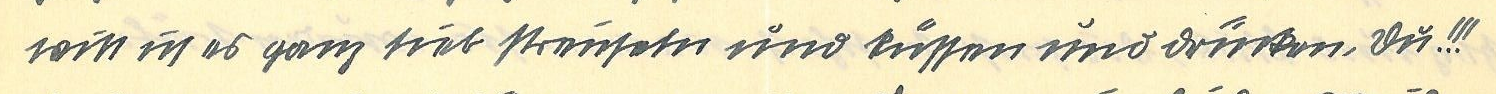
will ich es ganz lieb streicheln und küssen und drücken, Du!!!
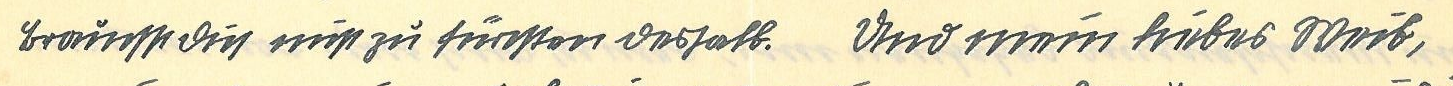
Brauchst Dich nicht zu fürchten deshalb. Und mein liebes Weib,
